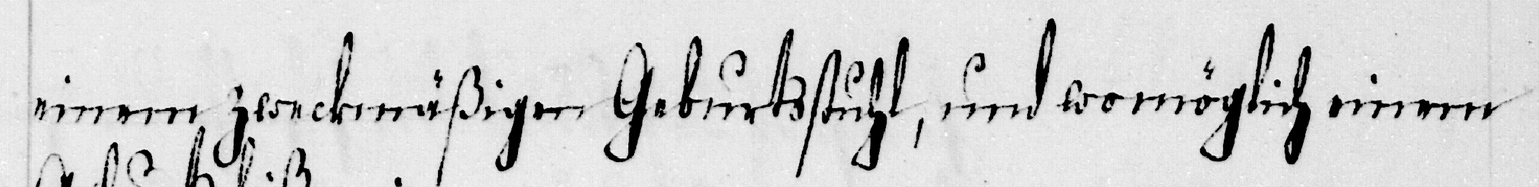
einem zweckmäßigen Geburtsstuhl, und womöglich einem
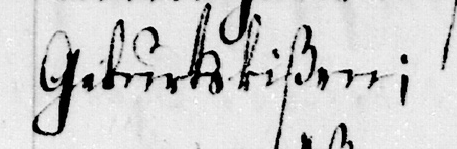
Geburtskißen;
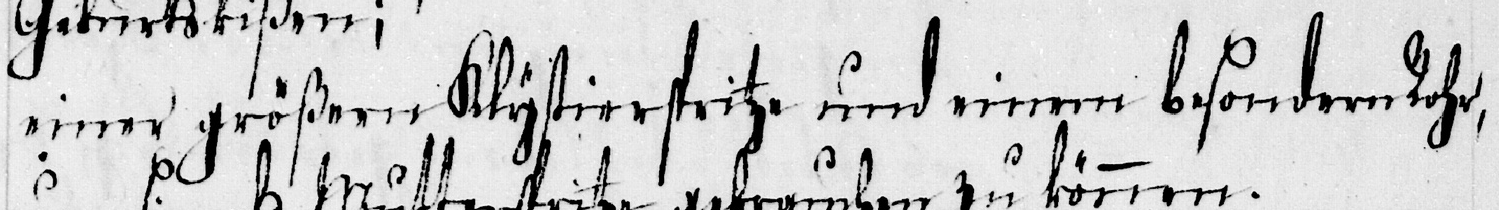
einer größern Klystierspritze und einem besondern Rohr,
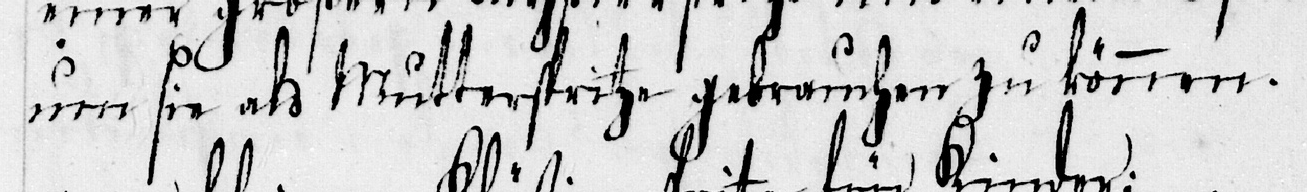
um sie als Mutterspritze gebrauchen zu können.
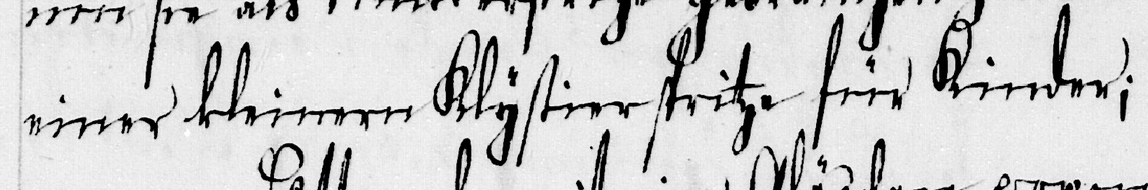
einer kleinern Klystierspritze für Kinder;
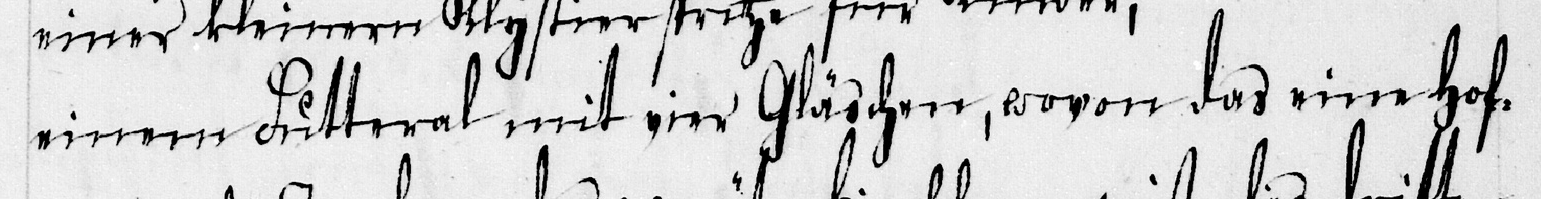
einem Futteral mit vier Gläschen, wovon das eine Hof¬
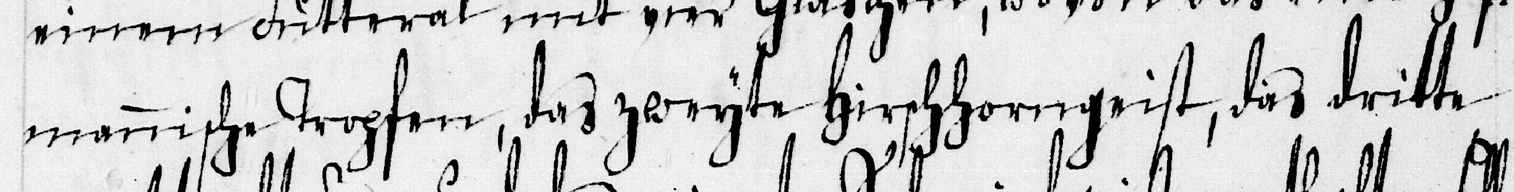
mannische Tropfen, das zweyte Hirschhorngeist, das dritte
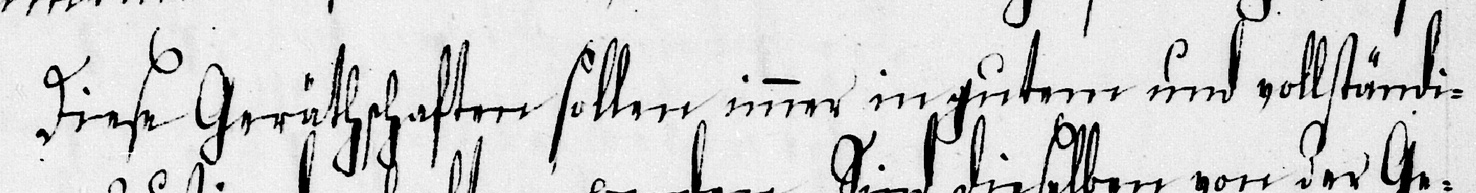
Diese Geräthschaften sollen immer in gutem und vollständ¬
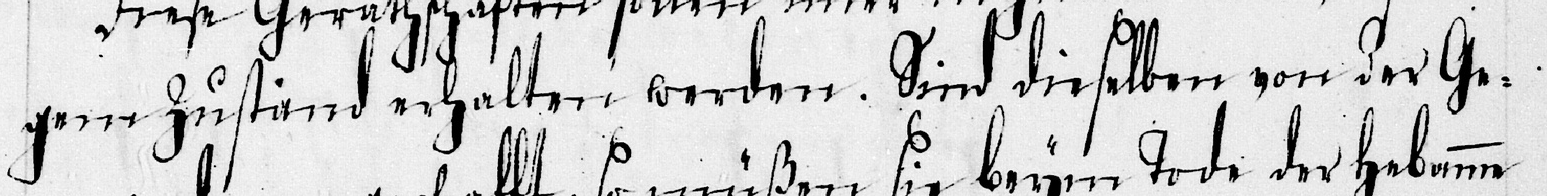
igem Zustand erhalten werden. Sind dieselben von der Ge¬
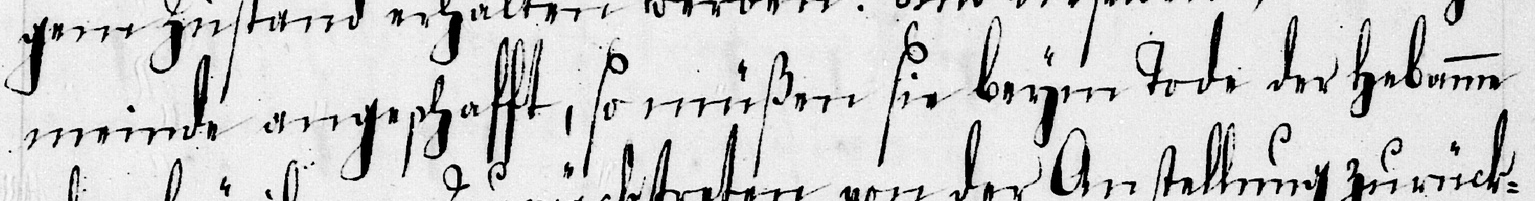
meinde angeschafft, so müßen sie beym Tode der Hebamme
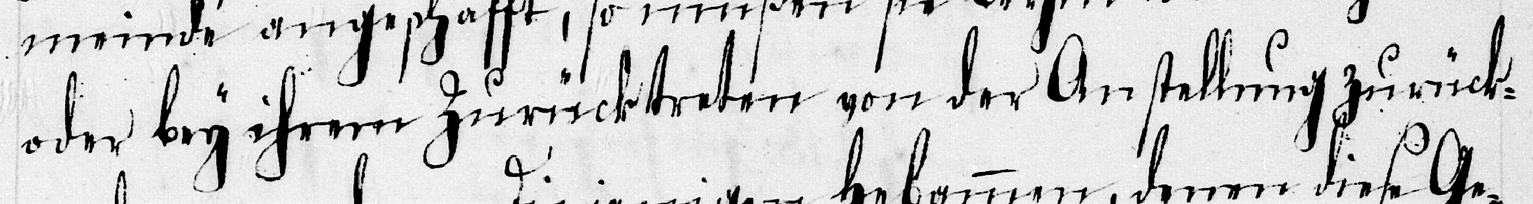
oder bey ihrem Zurücktreten von der Anstellung zurück¬
